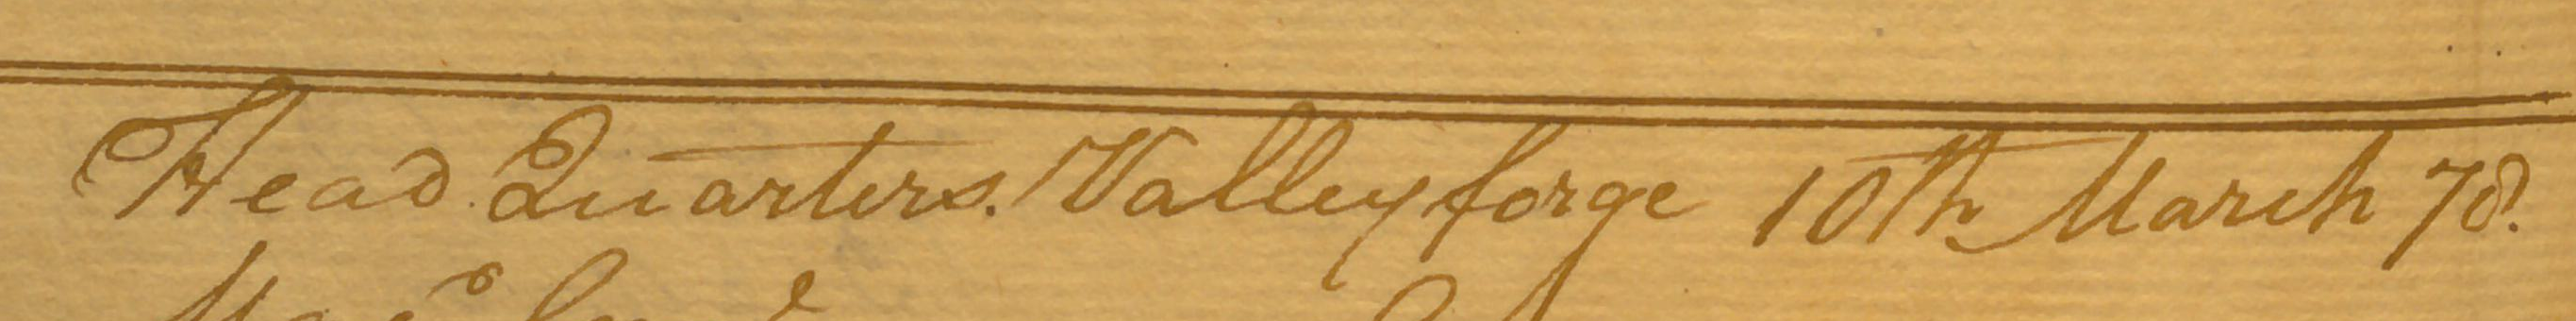Head Quarters. Valley forge 10th March 78.
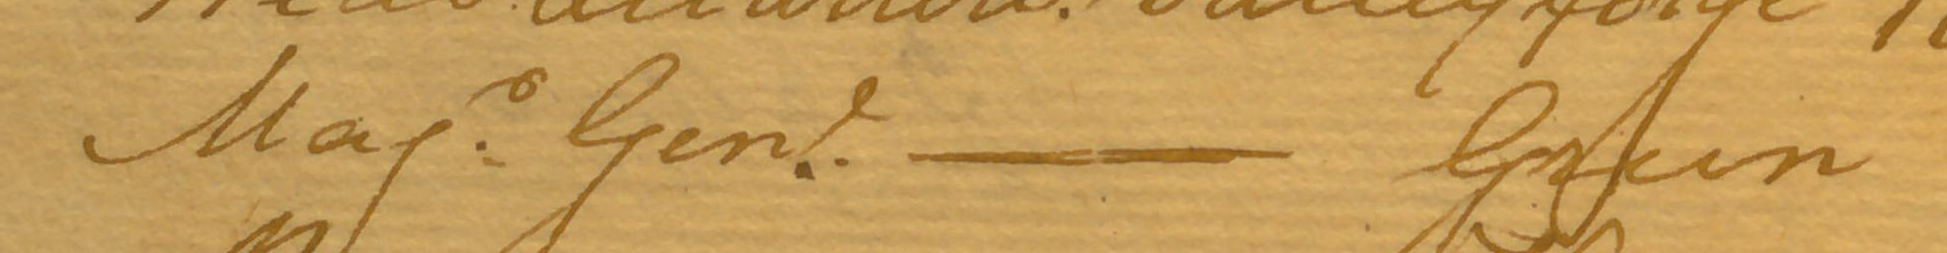Maj^r. Gen^l.- Green
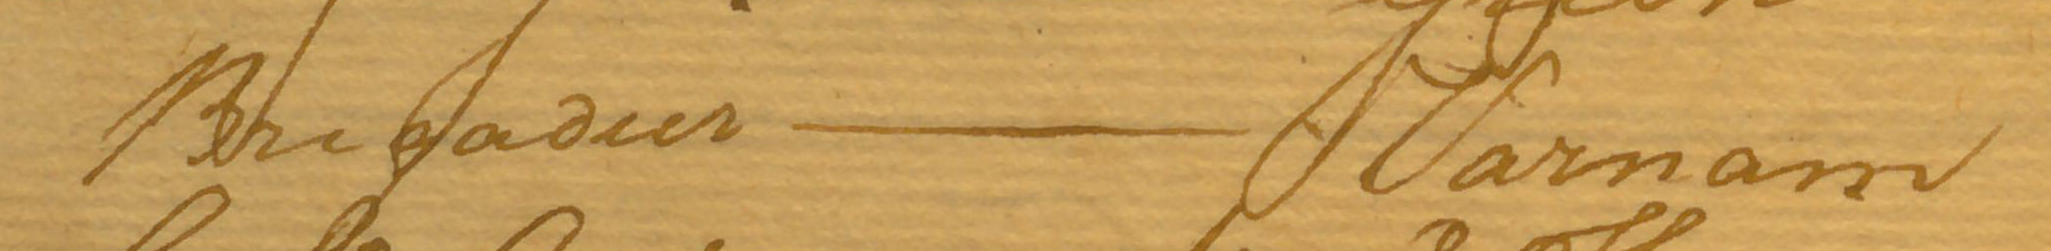Brigadier- Varnam
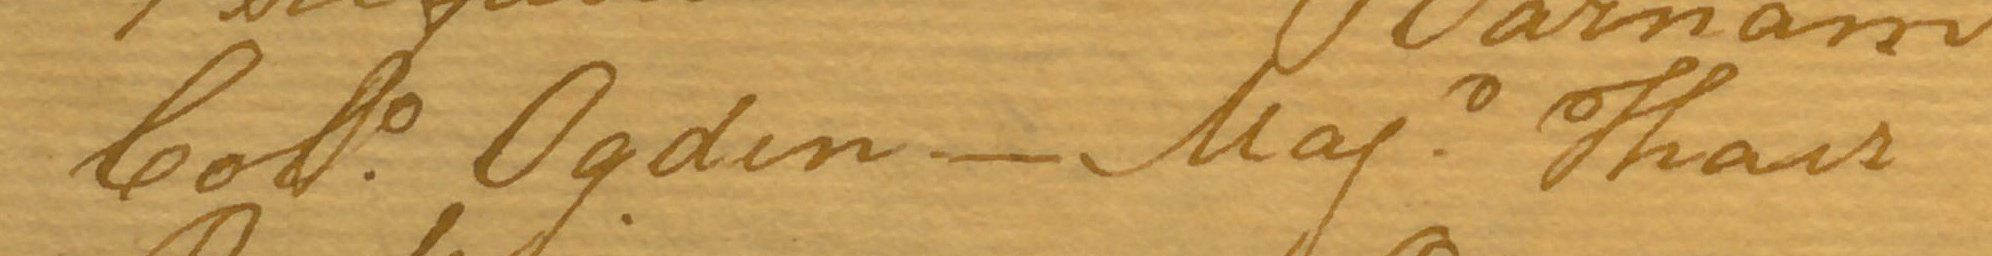Col^o. Ogden- Maj^r. Thair
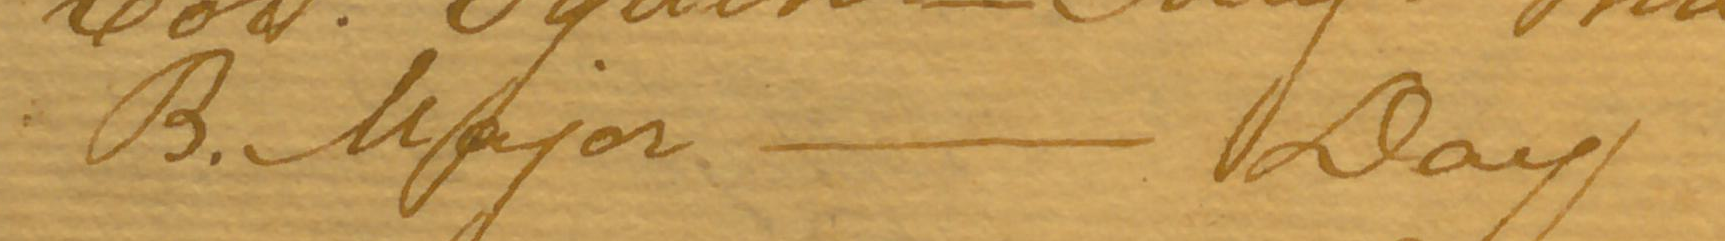B. Major- Day
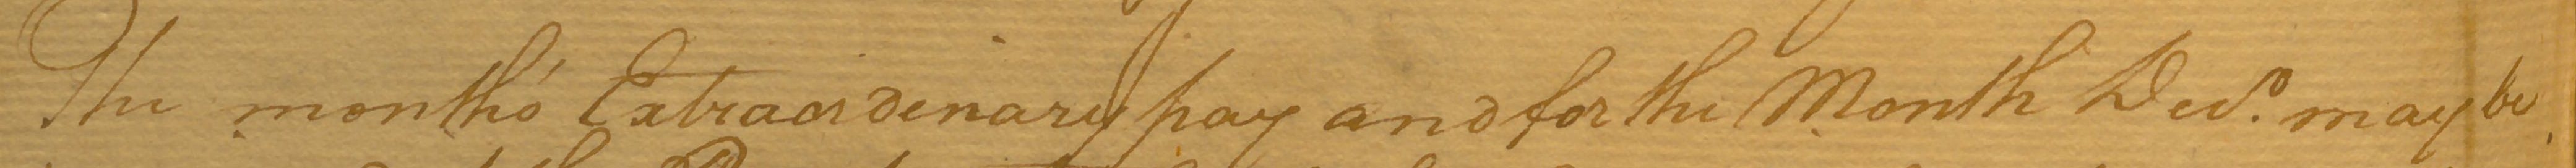The month's Extraordinary pay and for the Month Dec^r. maybe
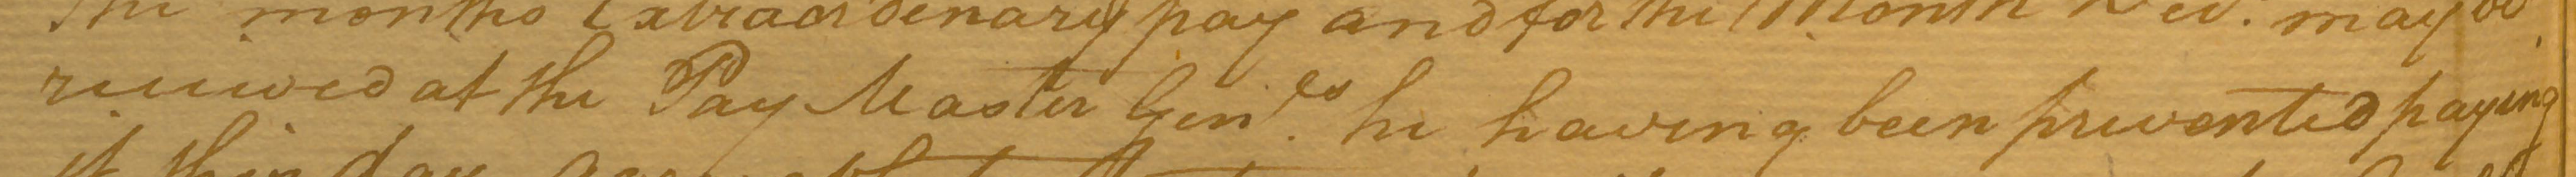received at the Pay Master Gen^ls. he having been prevented paying
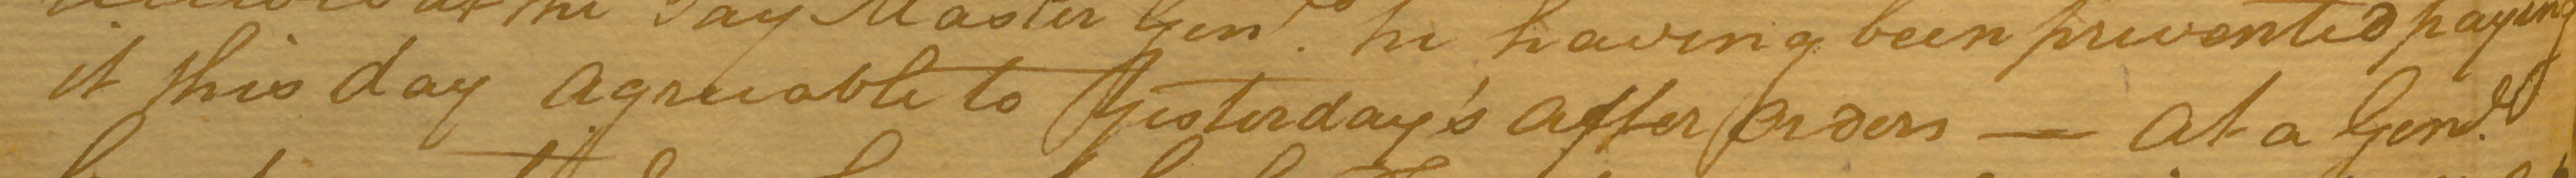it this day agreeable to Yesterday's after orders- At a Gen^l.
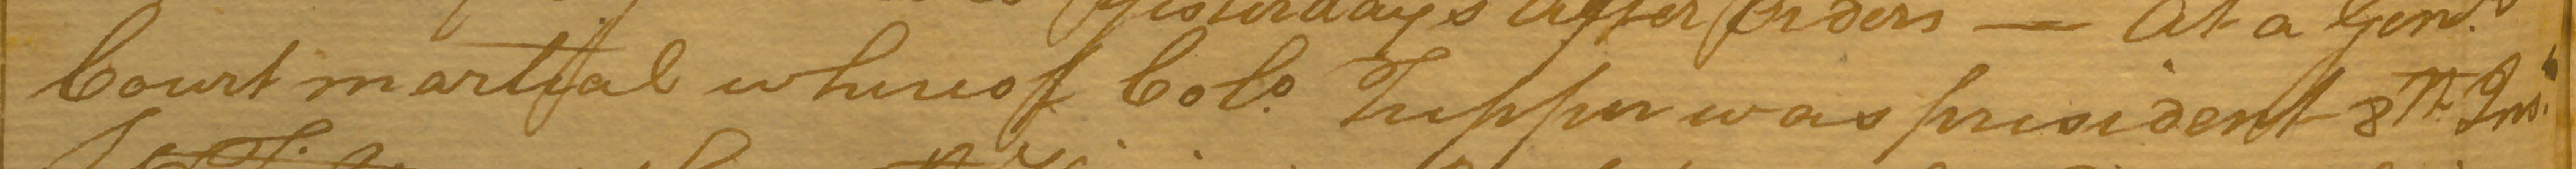Court martial whereof Col^o. Tupper was president 8^th. Ins^t.
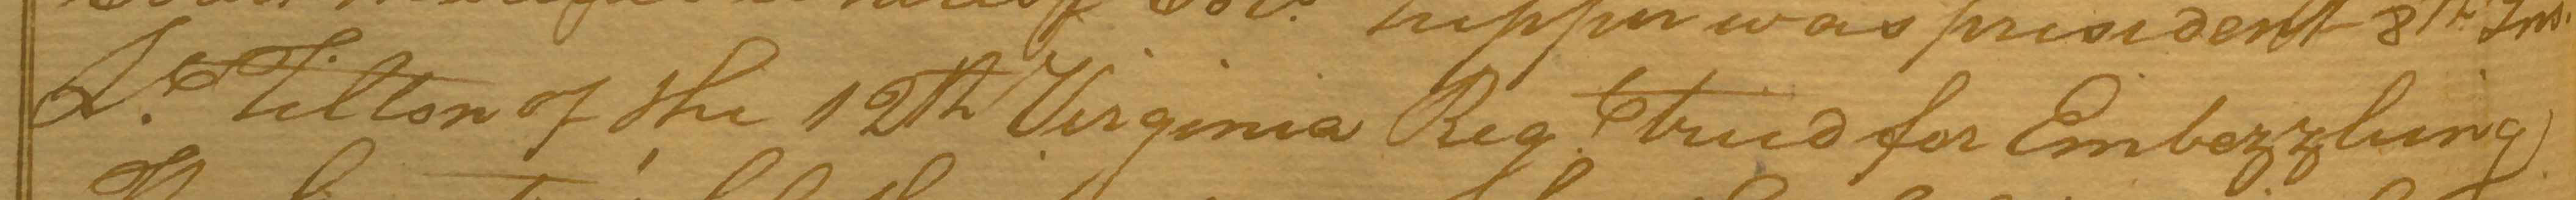L^t. Tilton of the 12th Virginia Reg^t. tried for Embezzling
